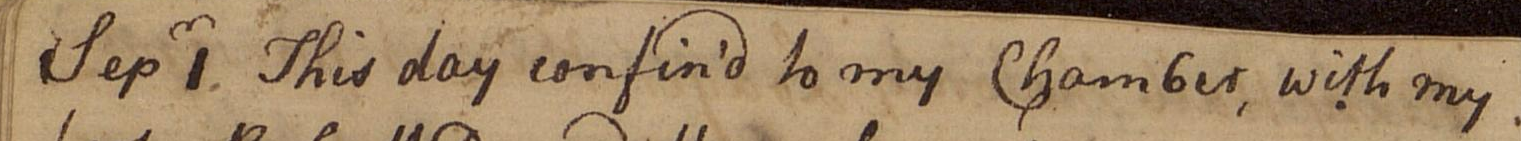Sep ^m 1. This day confin'd to my Chamber, with my
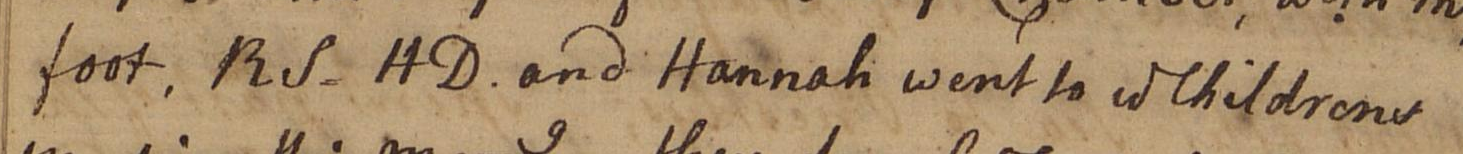foot. RS. HD. and Hannah went to y^e Childrens
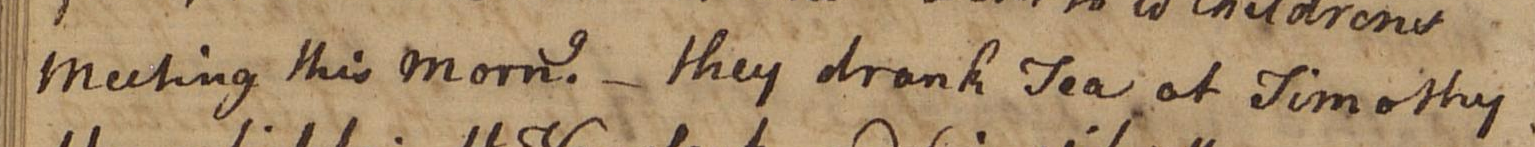meeting this morn^g.- they drank Tea at Timothy
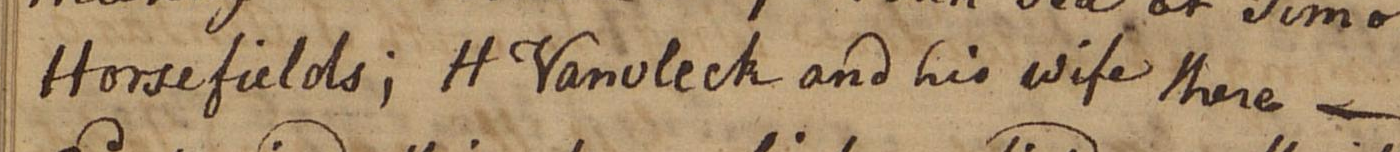Horsefields; H Vansleck and his wife there -
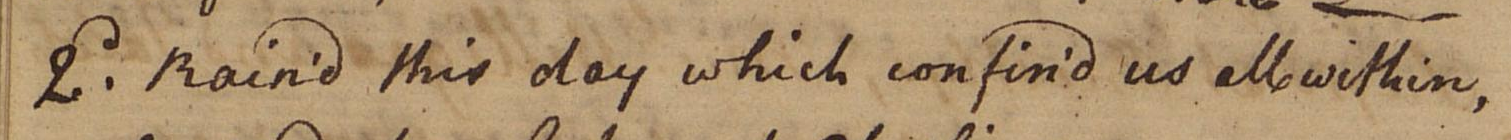2^d. Rain'd this day which confin'd us all within,
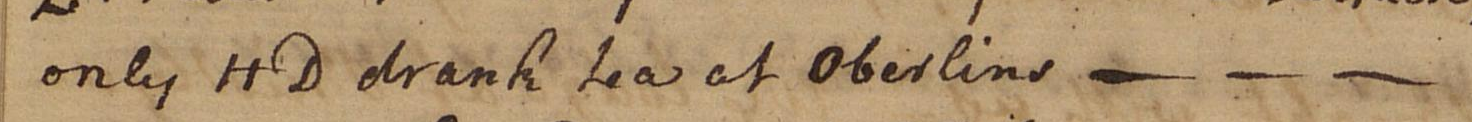only HD drank tea at Oberlins-
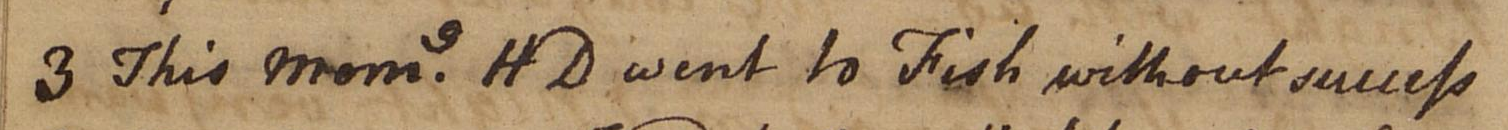3 This Morn^g. HD went to Fish without success
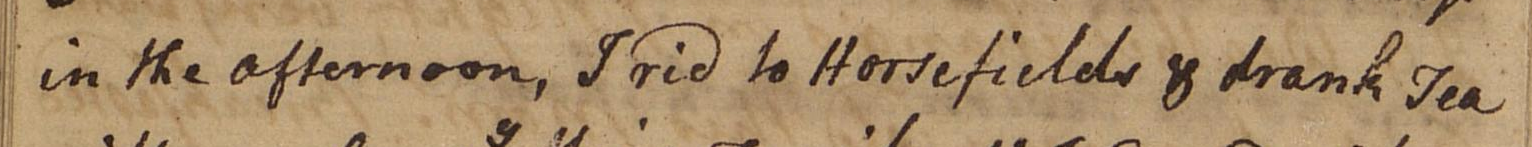in the afternoon, I rid to Horsefields & drank Tea
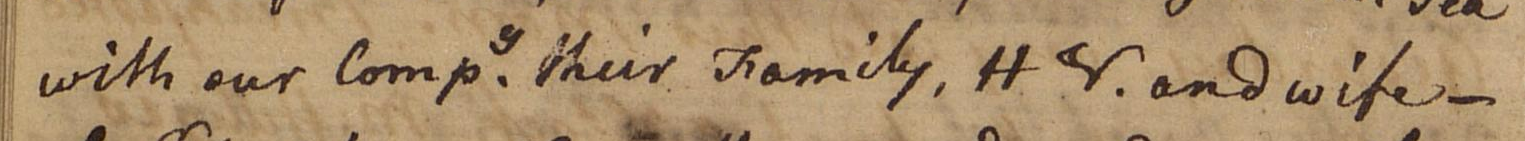with our Comp^y. their Family, HS. and wife -
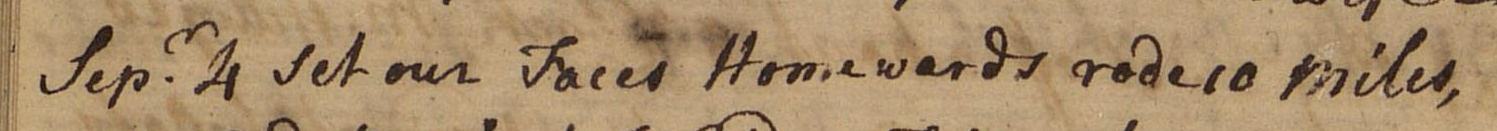Sep^m. 4 set our Faces Homewards rode 10 miles,
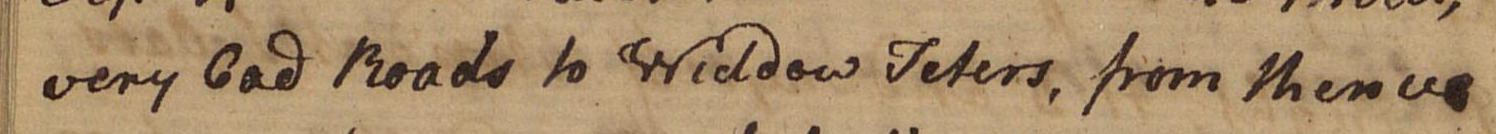very bad Roads to Widdow Teters, from then u
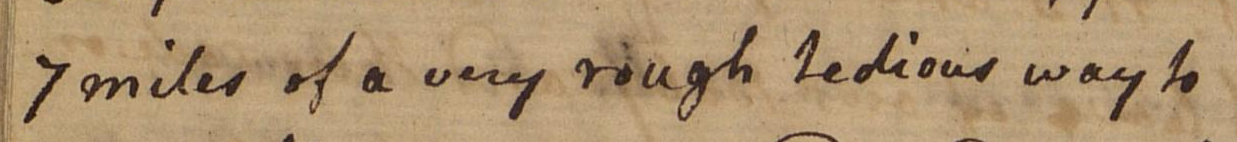7 miles of a very rough tedious way to
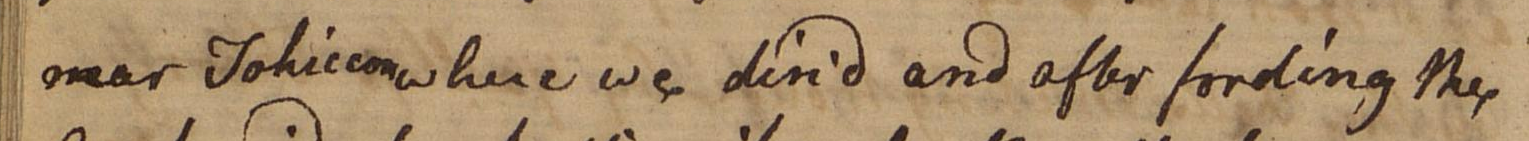near Tohiccon where we din'd and after fording the
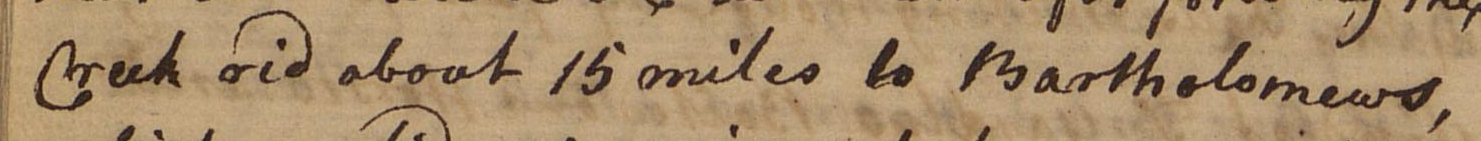Creek rid about 15 miles to Bartholomews,
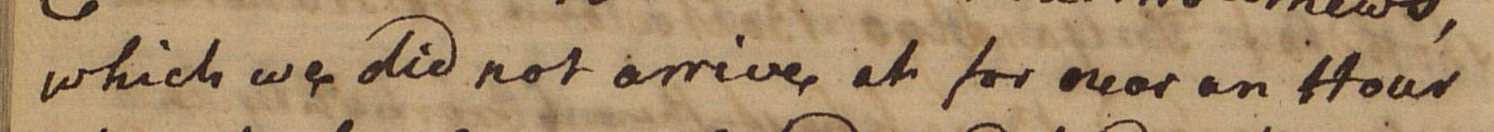which we did not arrive at for near an Hour
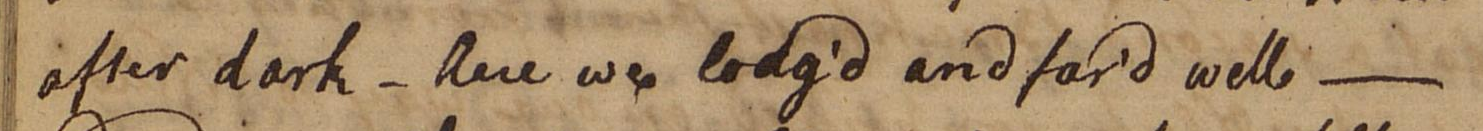after dark- here we lodg'd and far'd well-
